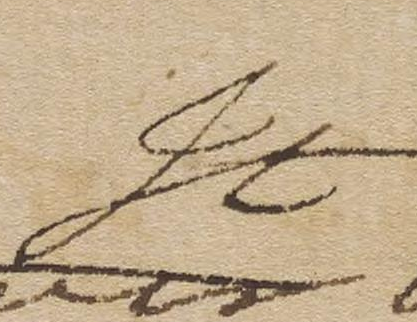It
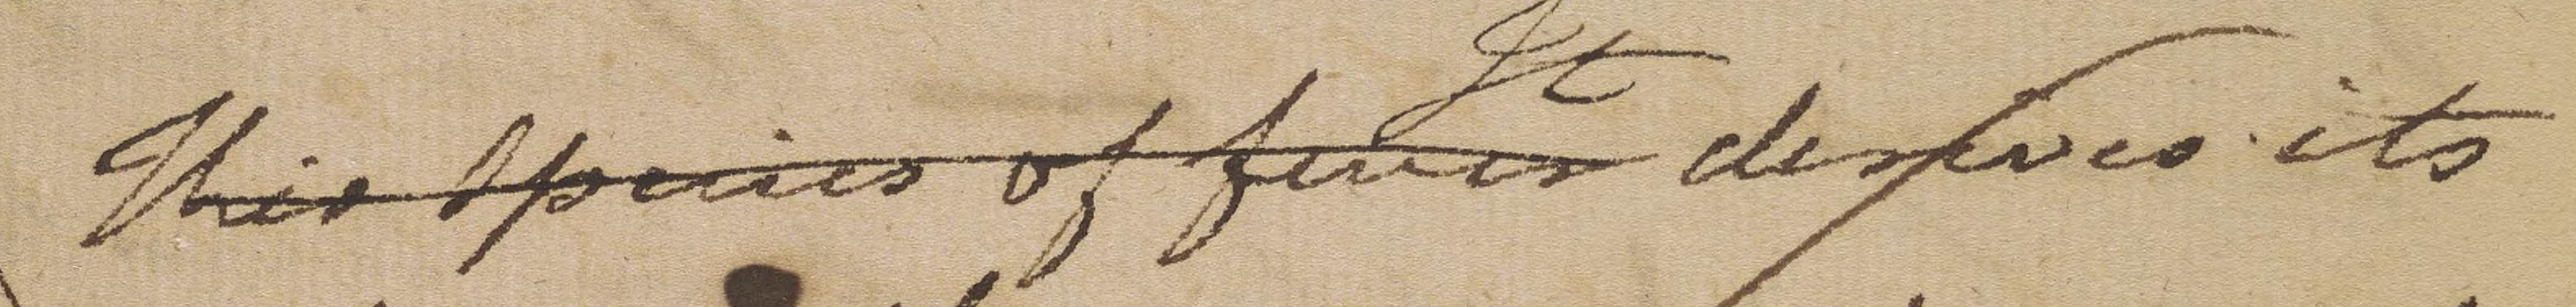[This species of fever] derives its
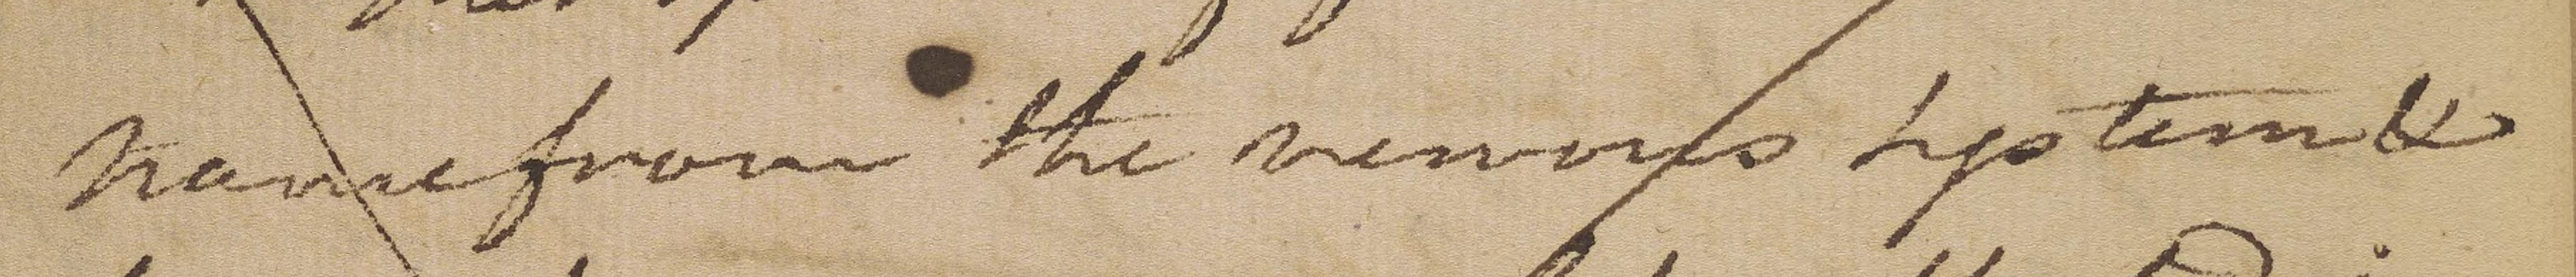name from the nervous system &
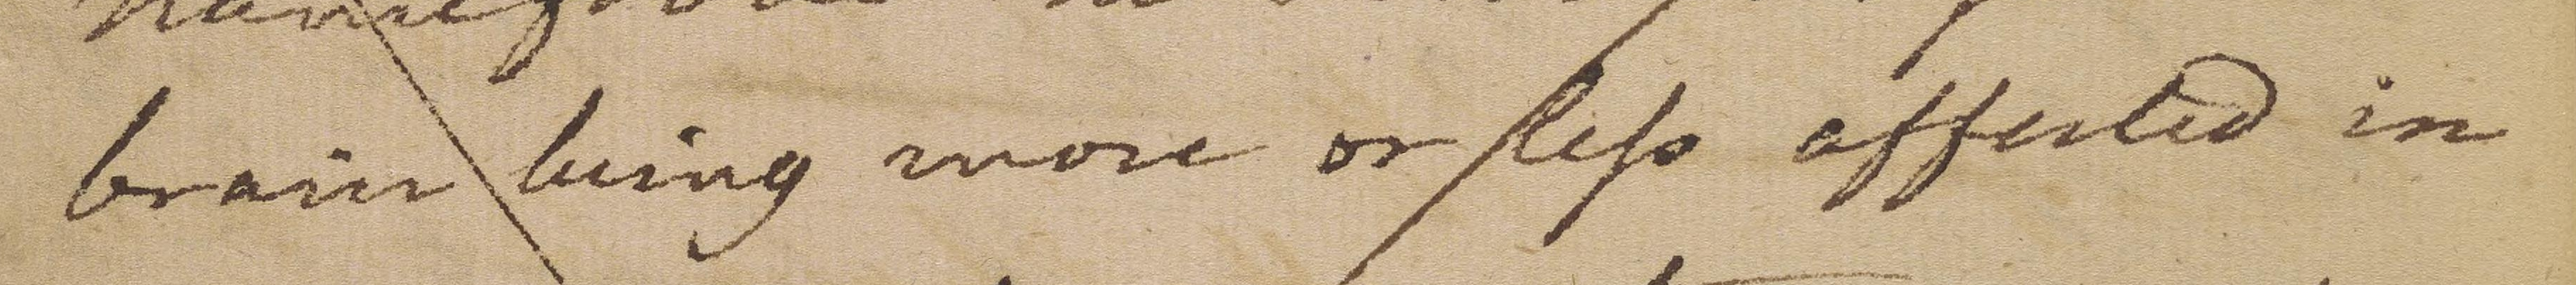brain being more or less affected in
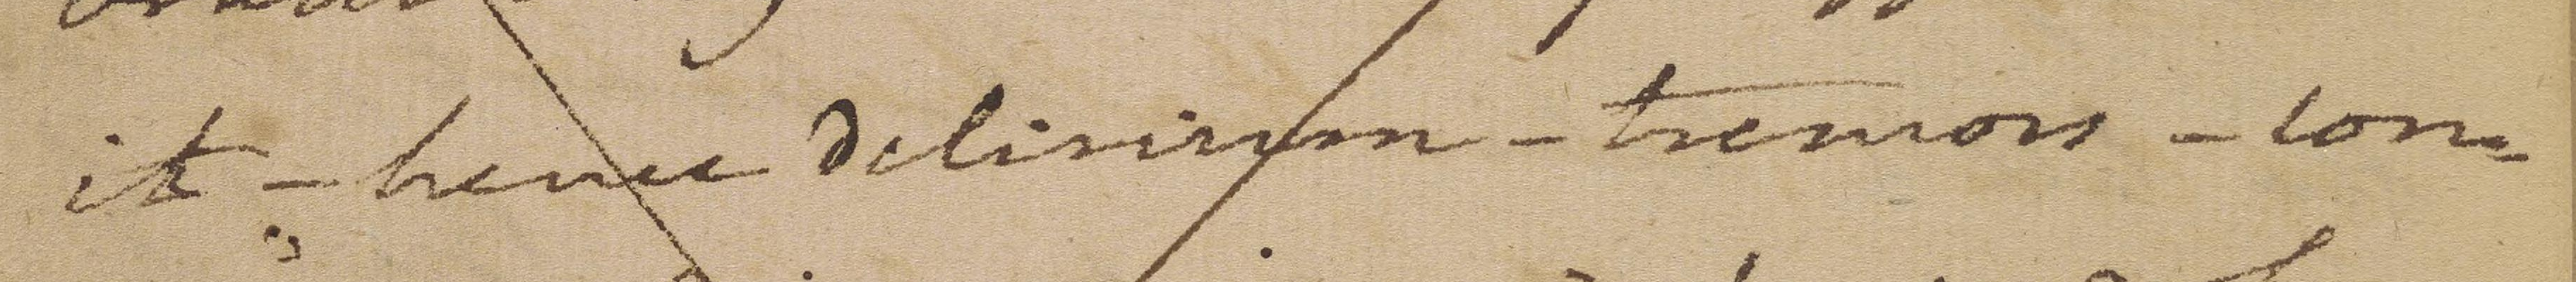it- hence delirium- tremors- con-
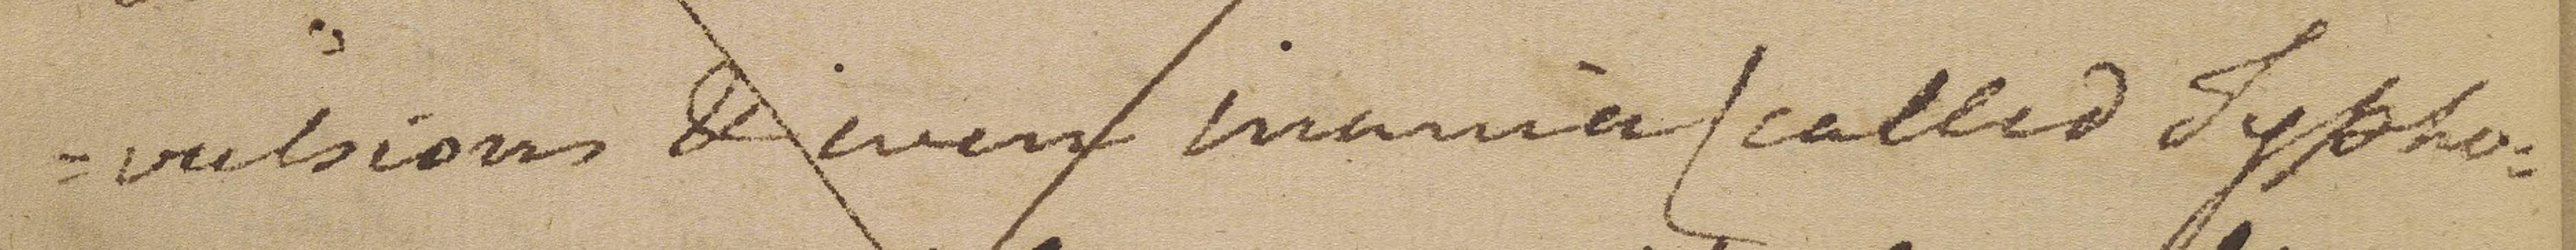-vulsions & even mania (called Sypho-
